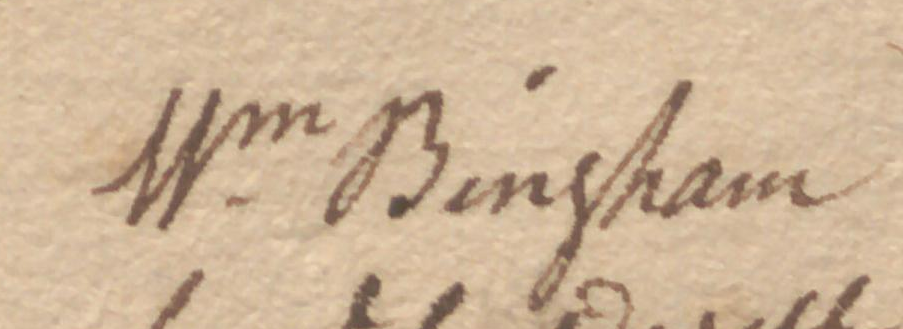W^m. Bingham
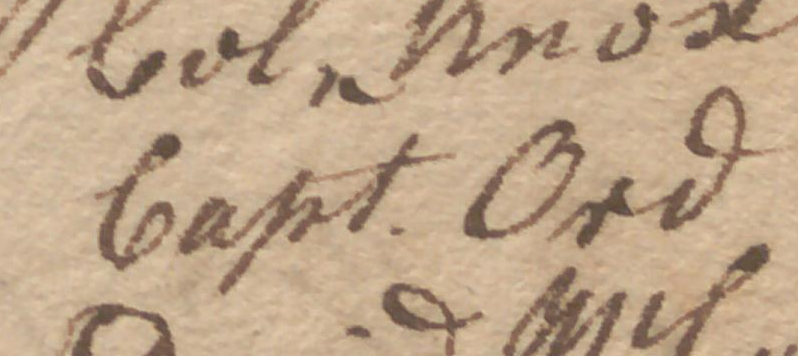Capt. Ord
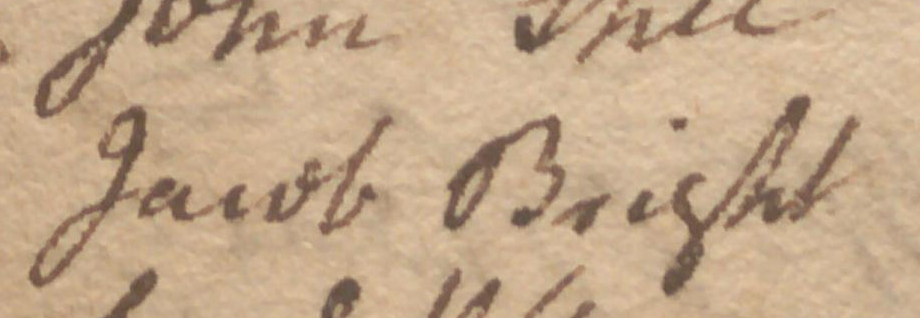Jacb Bright
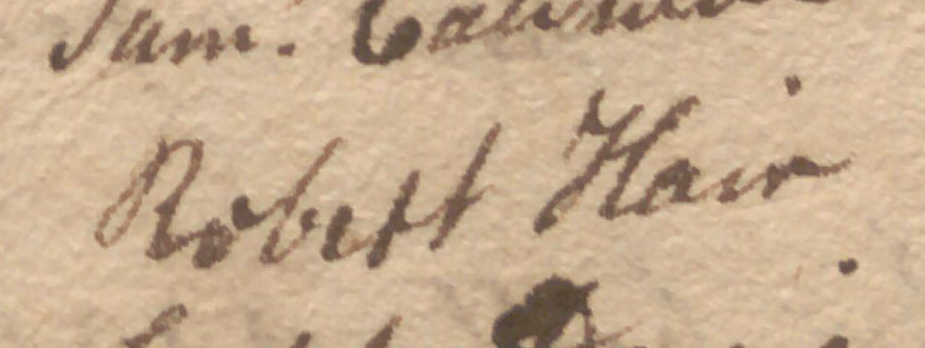Robert Hair
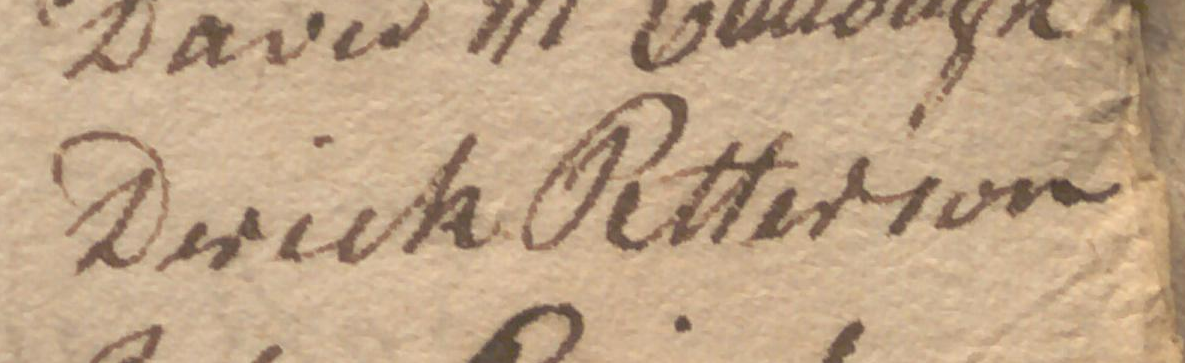Derick Petterson
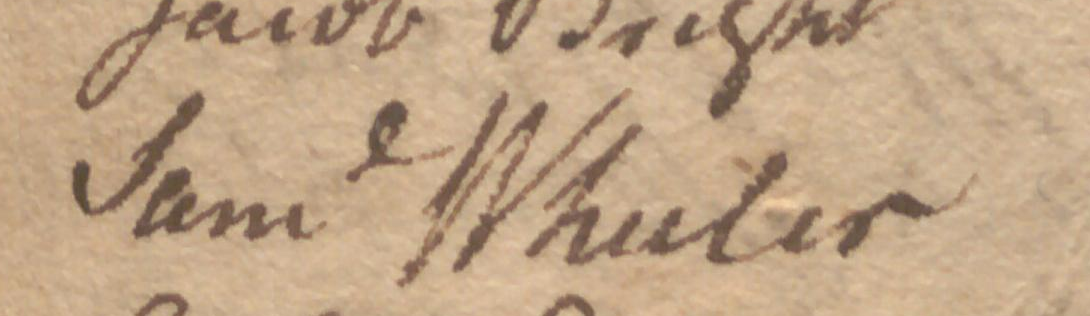Sam^l. Wheeler
